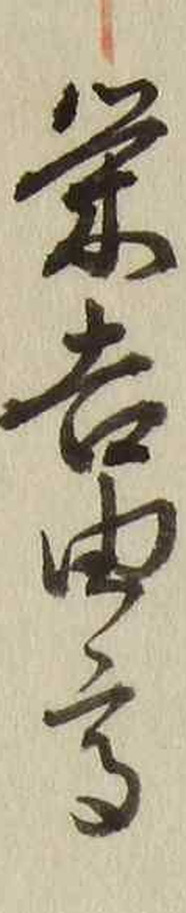栄吉由高
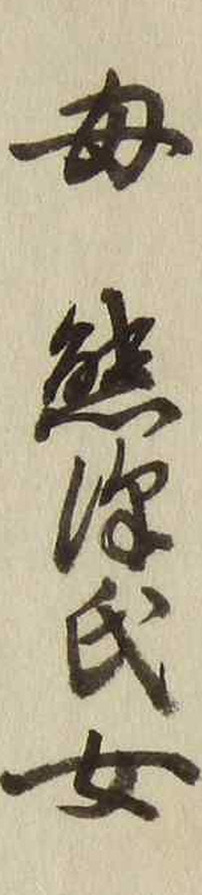母熊沢氏女

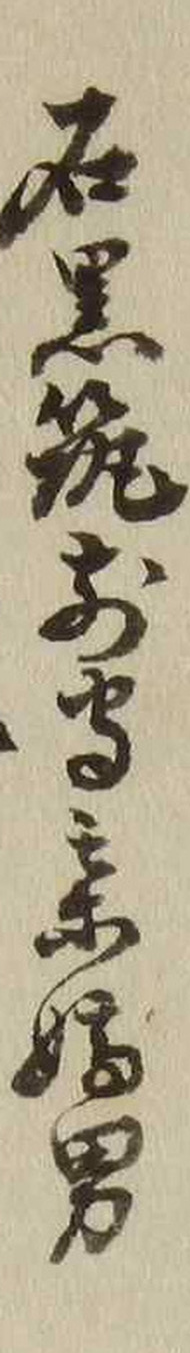石黒筑前守某嫡男
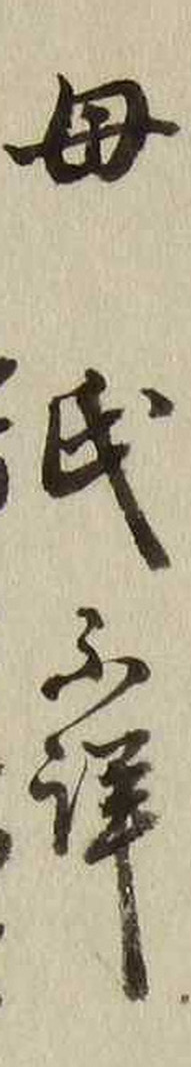母氏不詳
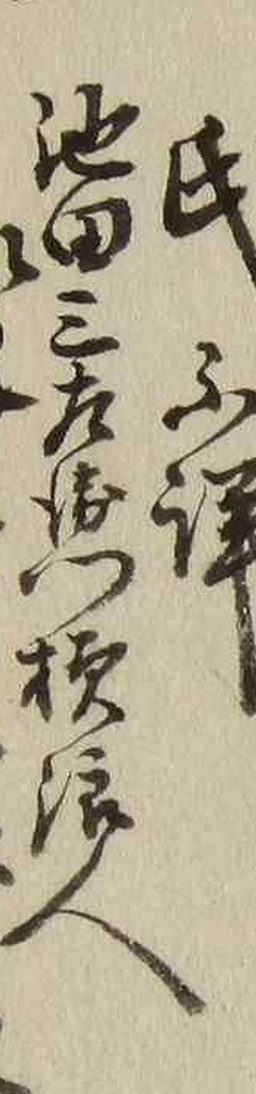妻池田三左衛門様浪人
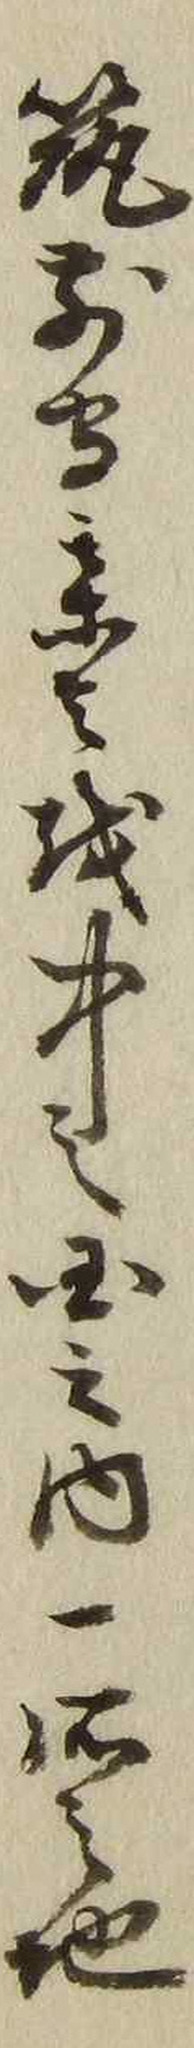筑前守某者越中之国之内一所之地
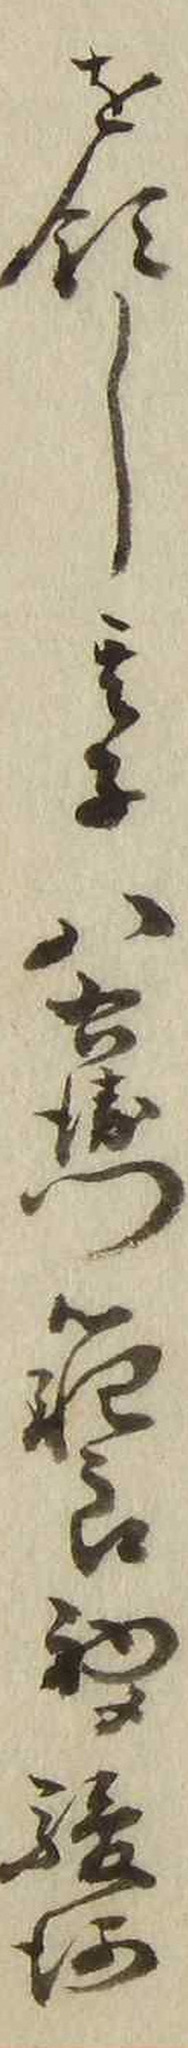を領し其子八右衛門範良初メ駿河
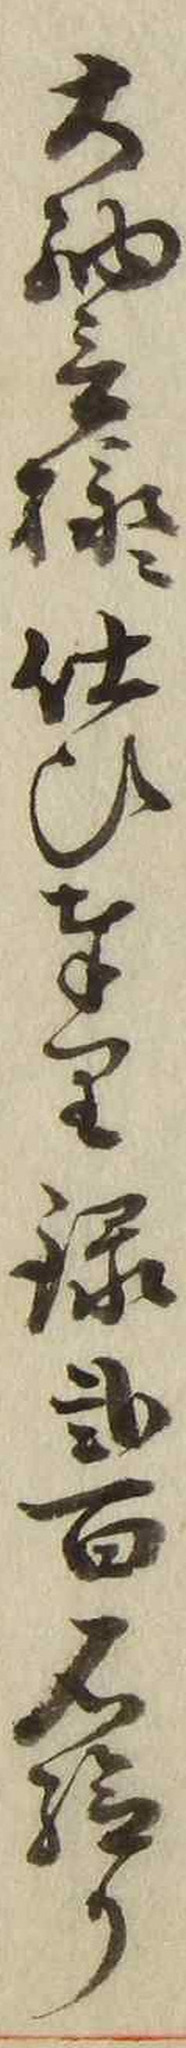大納言様ニ仕ひ奉里録弐百石給り

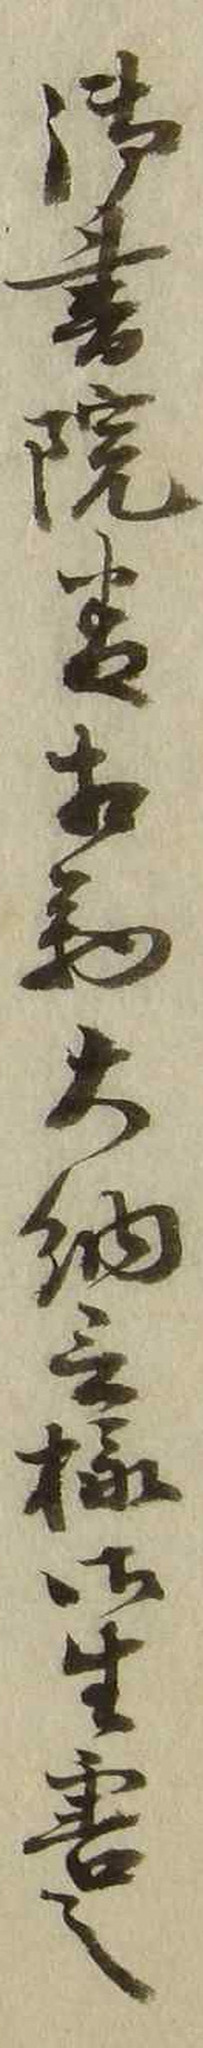御書院番相勤大納言様御生害之
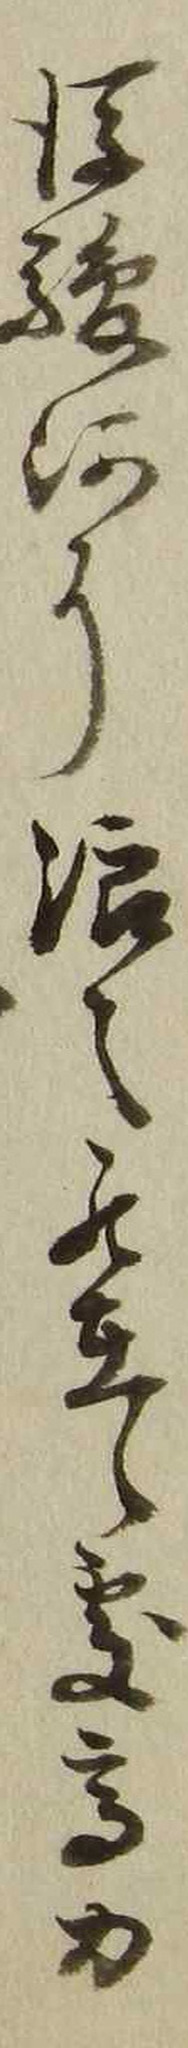後駿河に浪々罷在候処高力
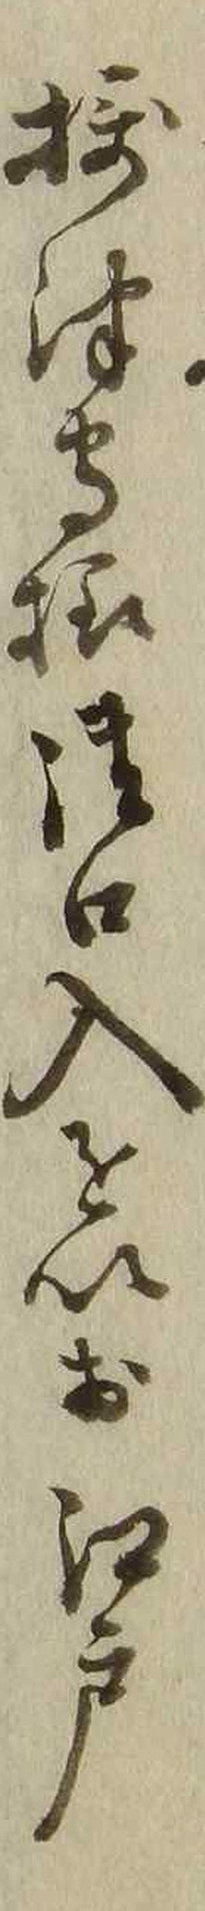摂津守様御口入を以於江戸
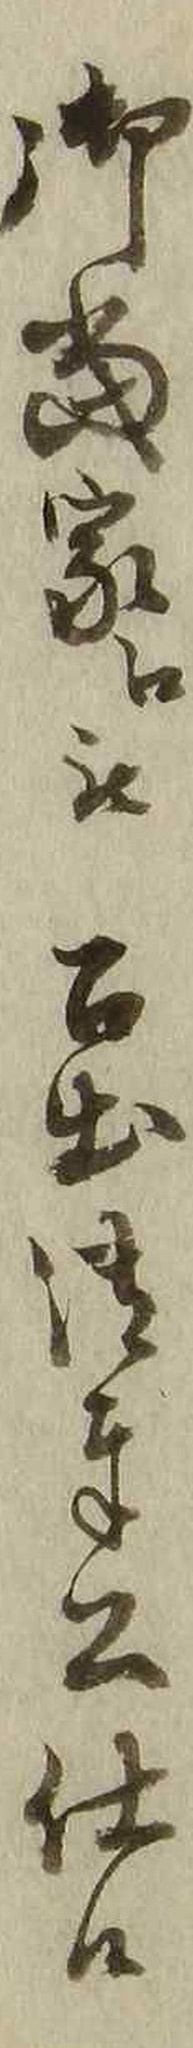御当家江被召出御奉公仕候
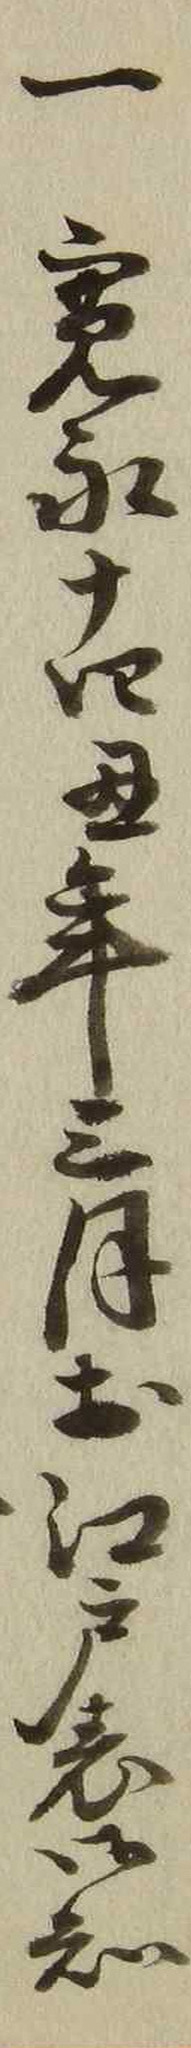一寛永十四丑年三月於江戸表御知
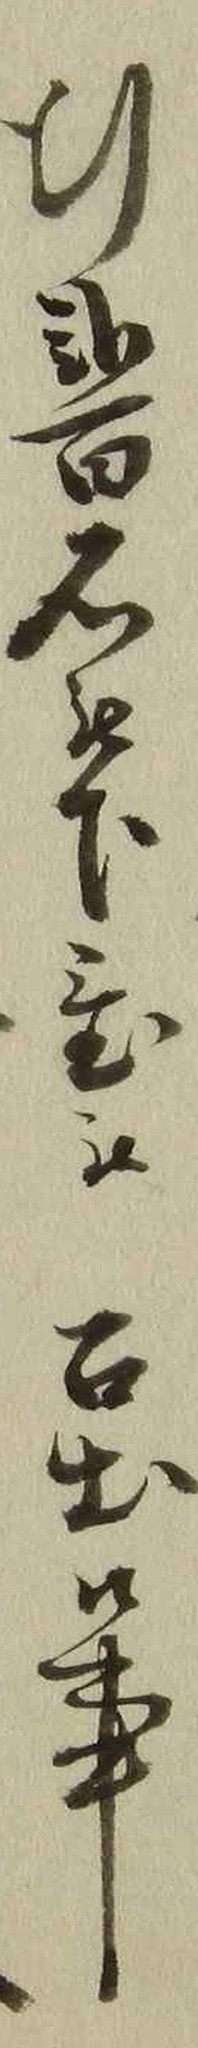行弐百石被下置被召出候事
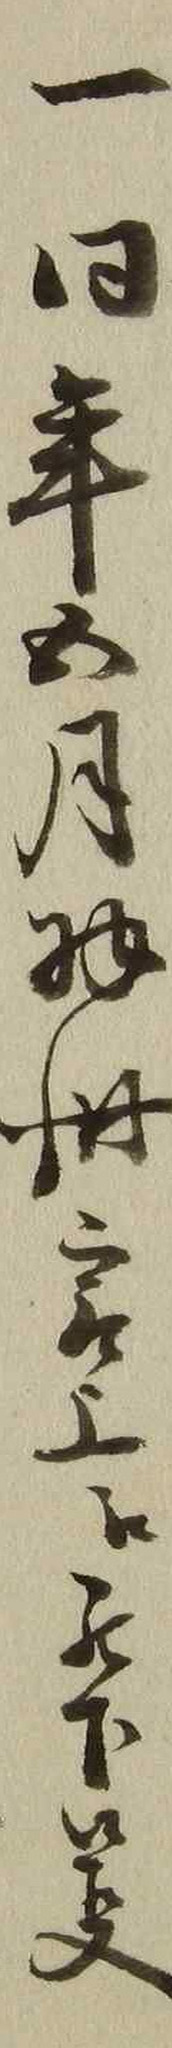一同年五月羽州最上江罷下候事
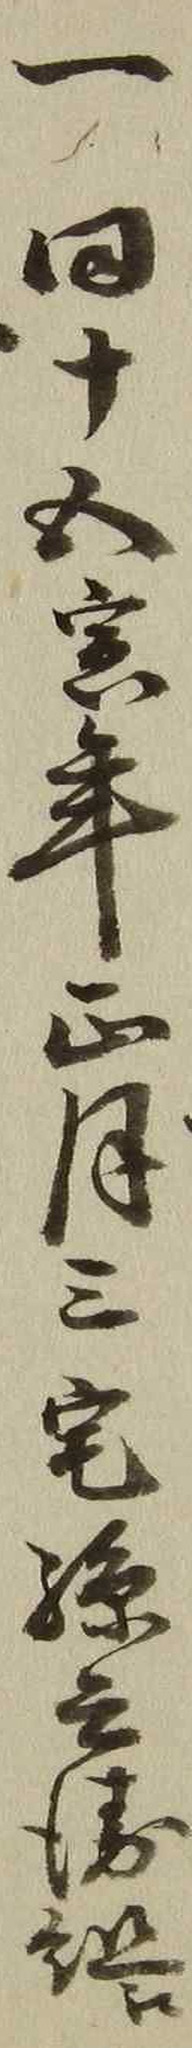一同十五寅年正月三宅孫兵衛組江
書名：諸士系譜　巻之31　い之部31
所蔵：会津若松市立会津図書館
